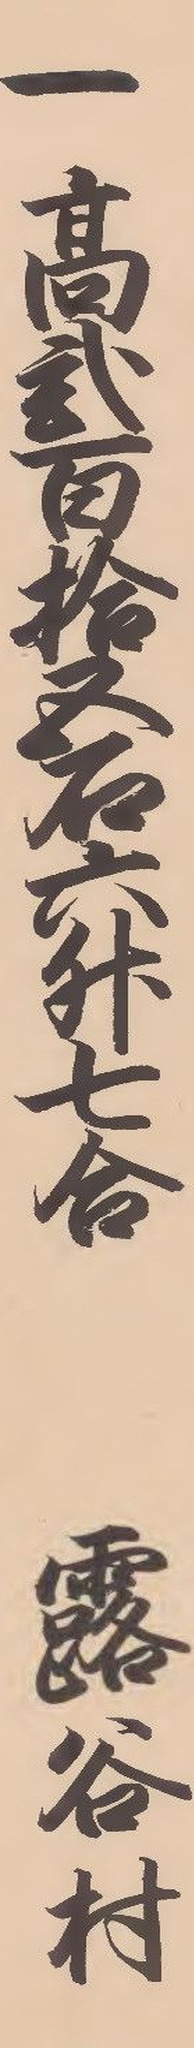一高弐百拾五石六升七合露谷村
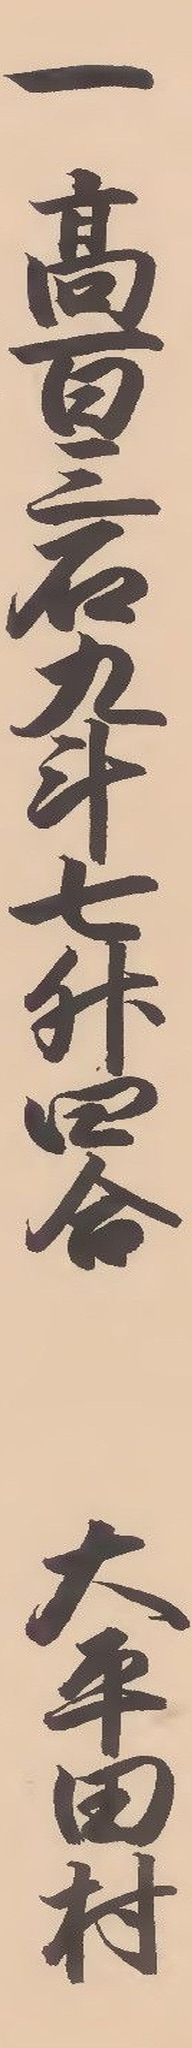一高百三石九斗七升四合大平田村
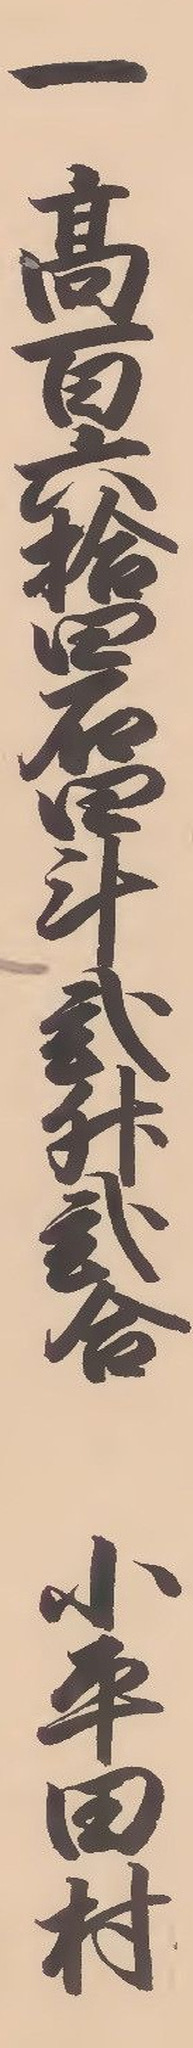一高百六拾四石四斗弐升弐合小平田村

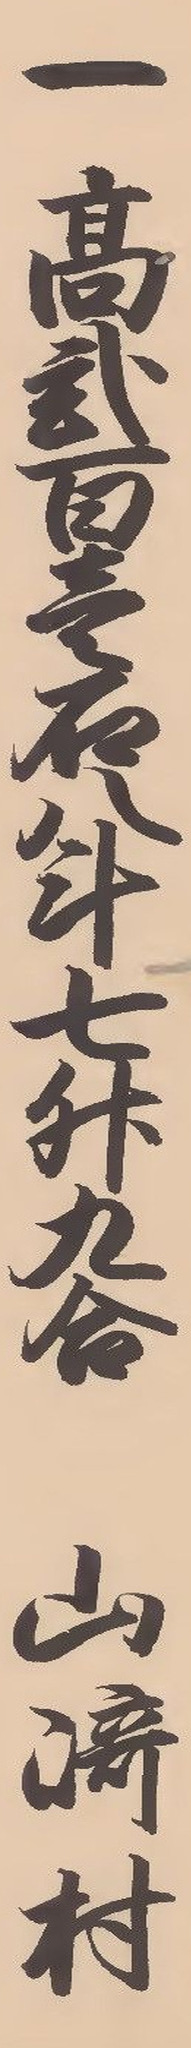一高弐百壱石八斗七升九合山崎村
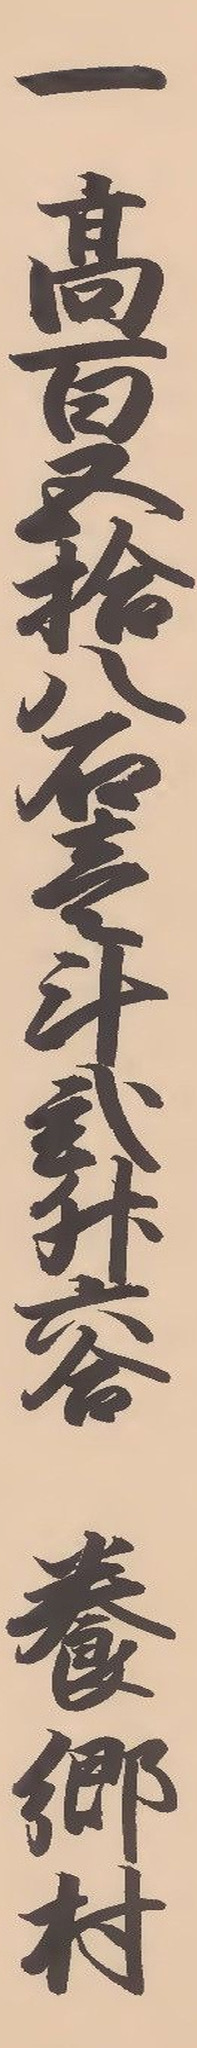一高百五拾八石壱斗弐升六合養郷村
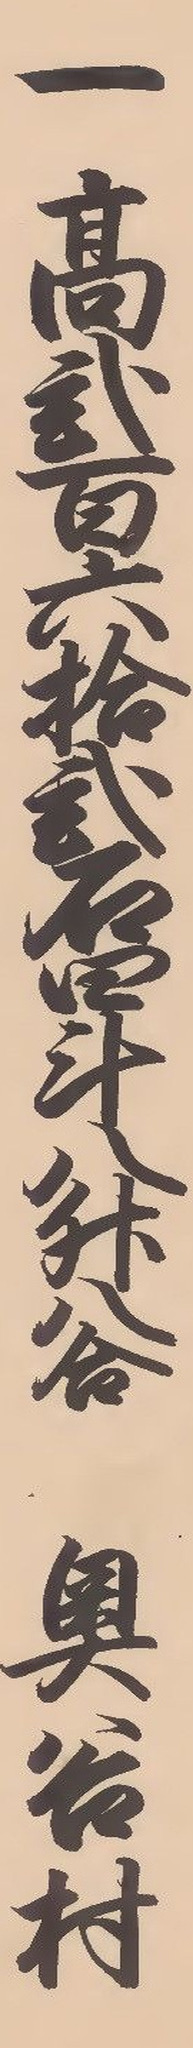一高弐百六拾弐石四斗八升八合奥谷村
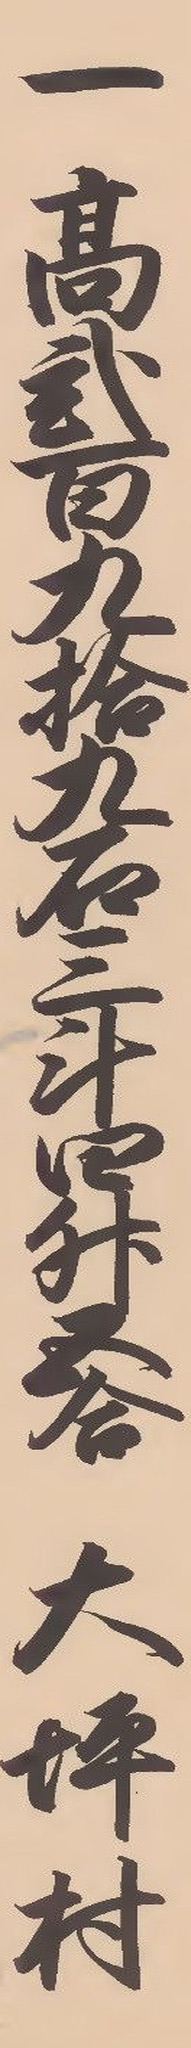一高弐百九拾九石三斗四升五合大坪村
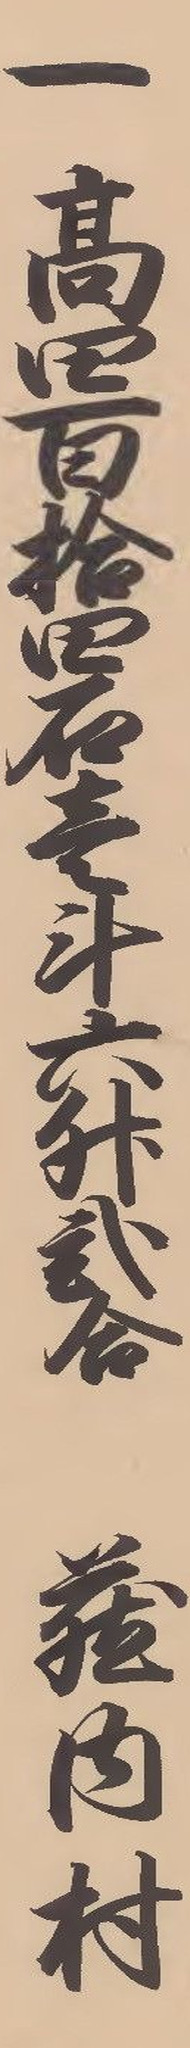一高四百拾四石壱斗六升弐合蔵内村
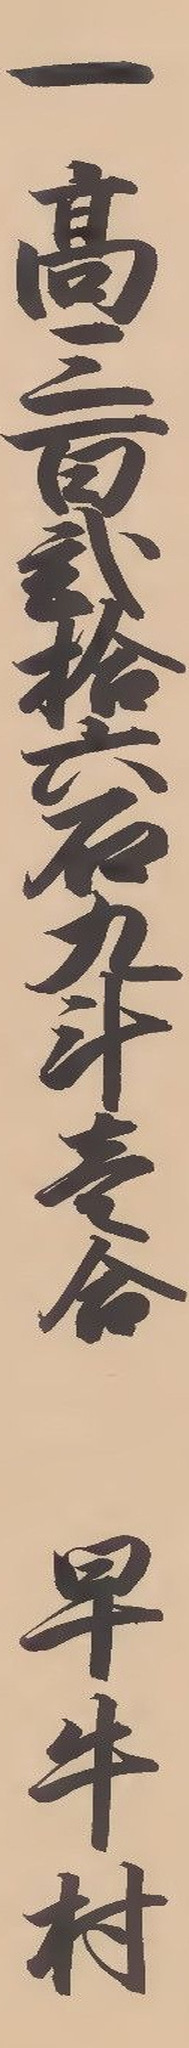一高三百弐拾六石九斗壱合早牛村
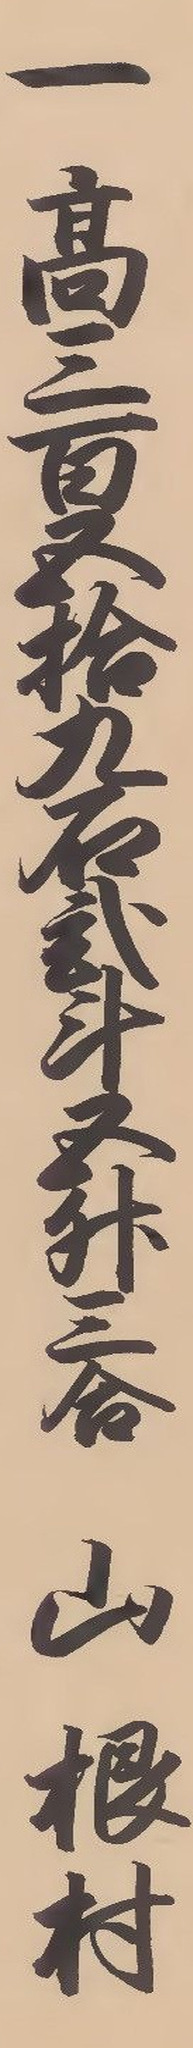一高三百五拾九石弐斗五升三合山根村
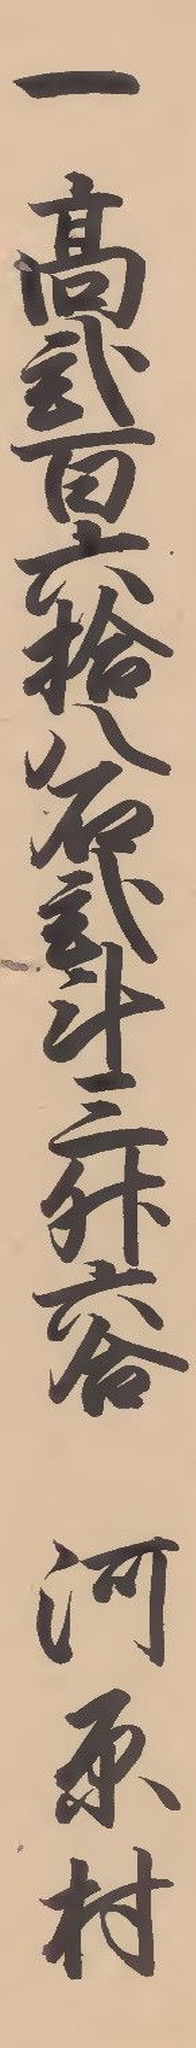一高弐百六拾八石弐斗三升六合河原村

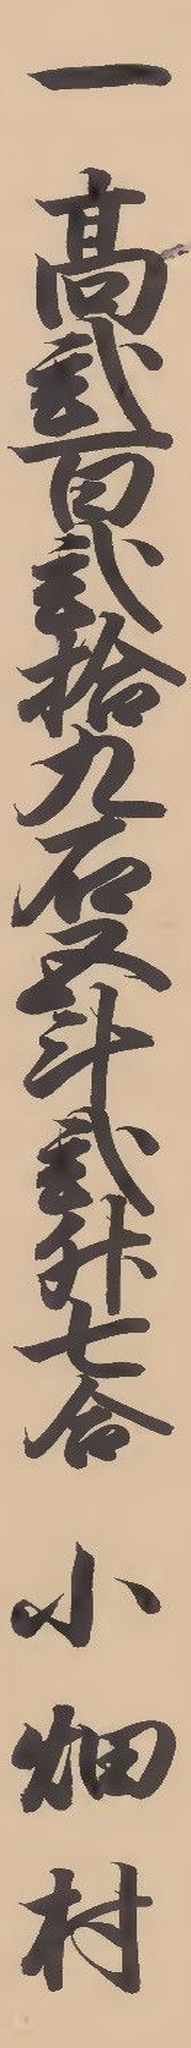一高弐百弐拾九石五斗弐升七合小畑村
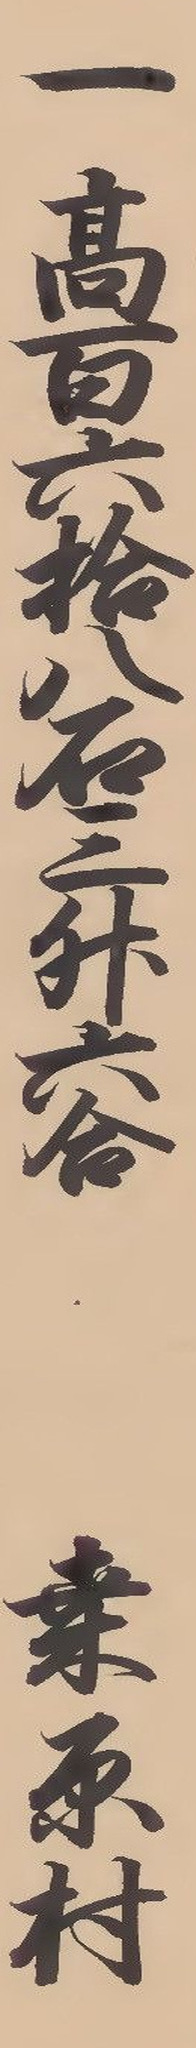一高百六拾八石三升六合桑原村
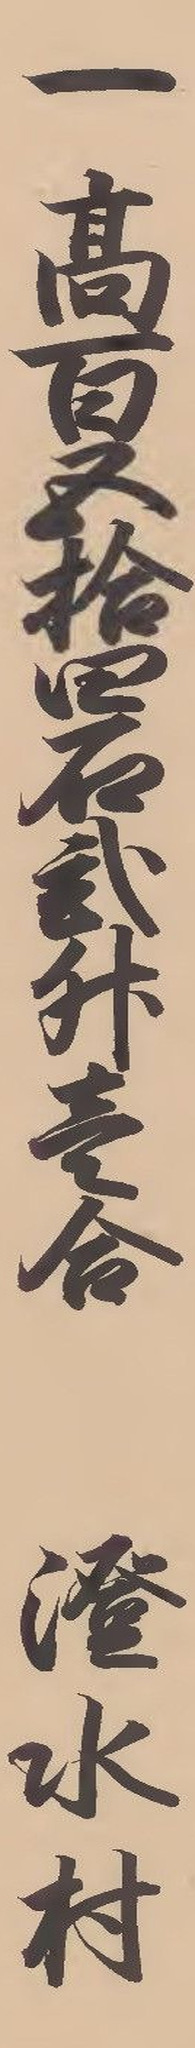一高百五拾四石弐升壱合澄水村
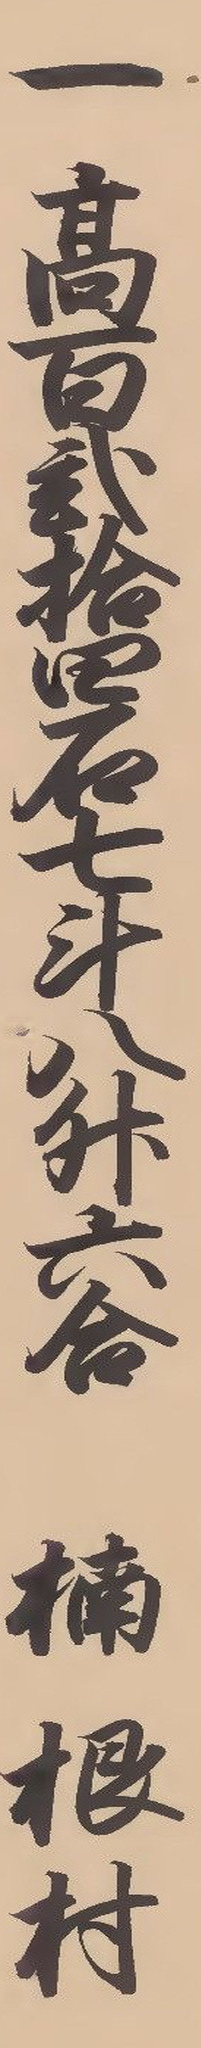一高百弐拾四石七斗八升六合楠根村
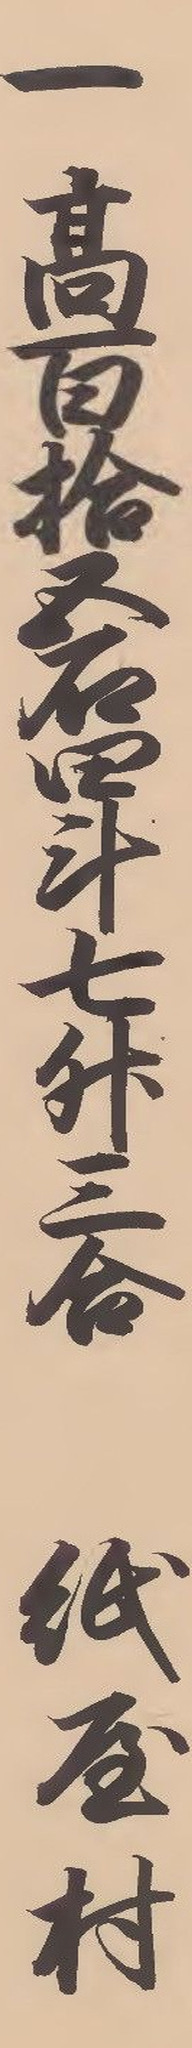一高百拾五石四斗七升三合紙屋村
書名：因幡国郷帳
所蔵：国立公文書館 National Archives of Japan
